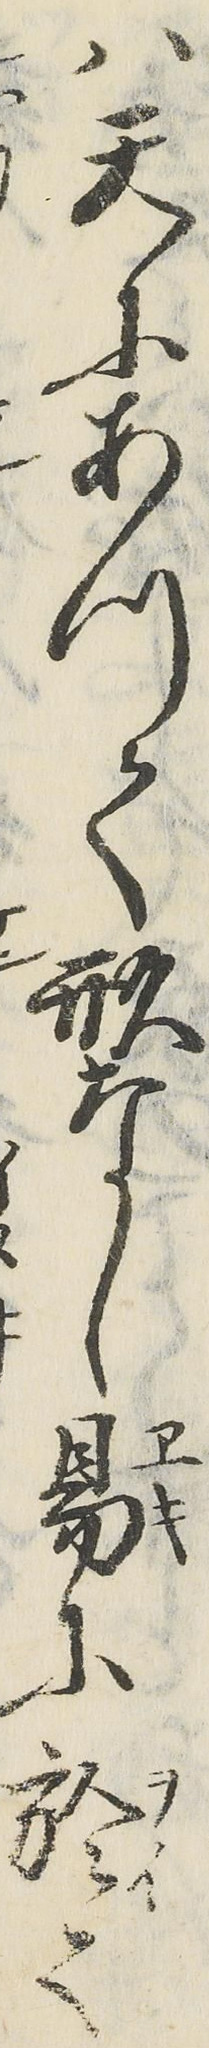は天にあつて形なし易に於て
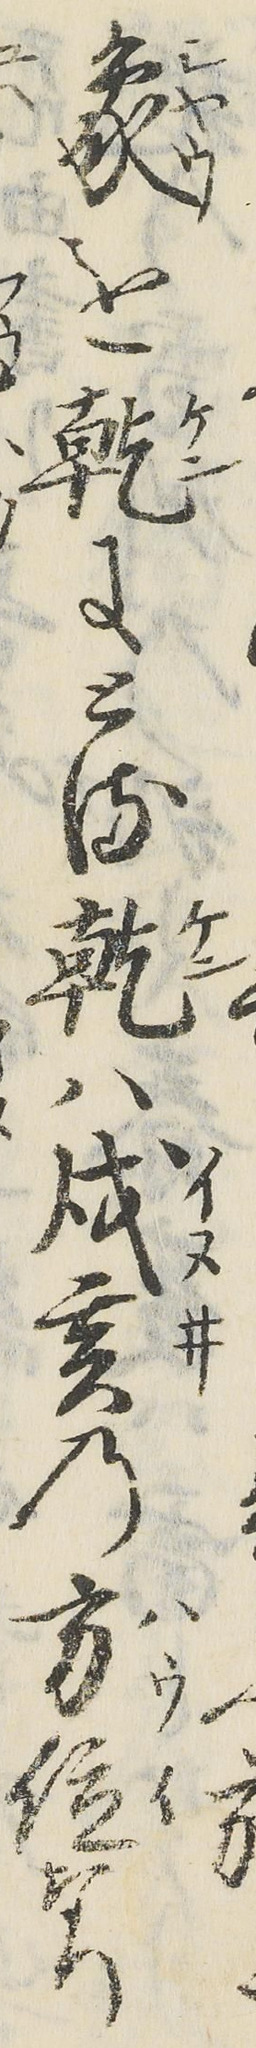象を乾にとる乾は戌亥の方位なり
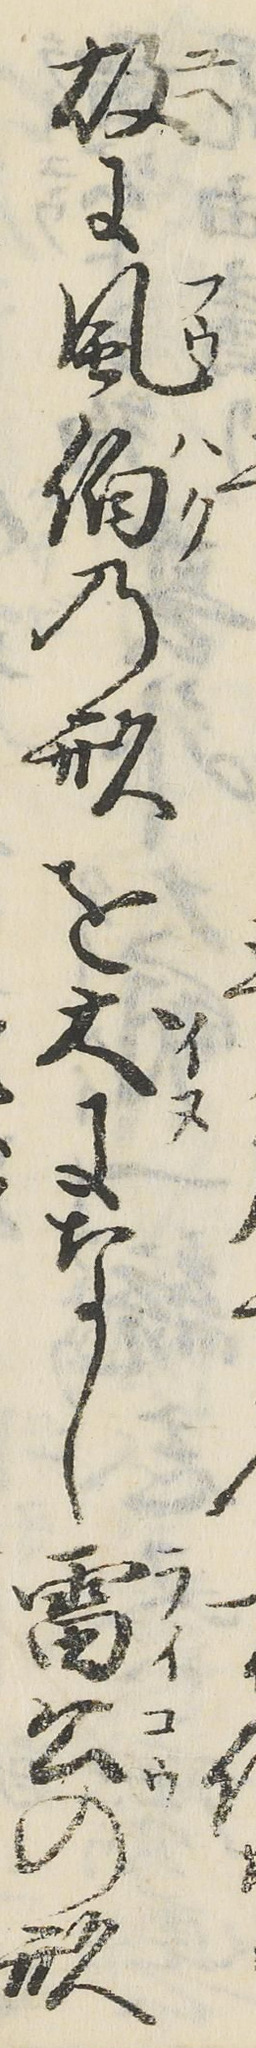故に風伯の形を犬になし雷公の形
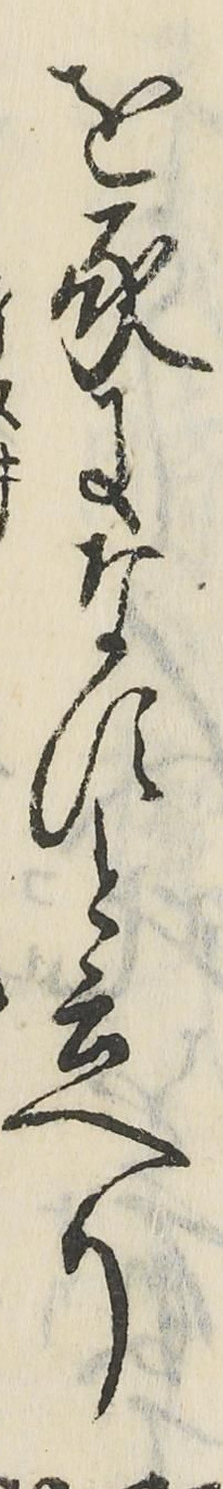を豕になすと云へり
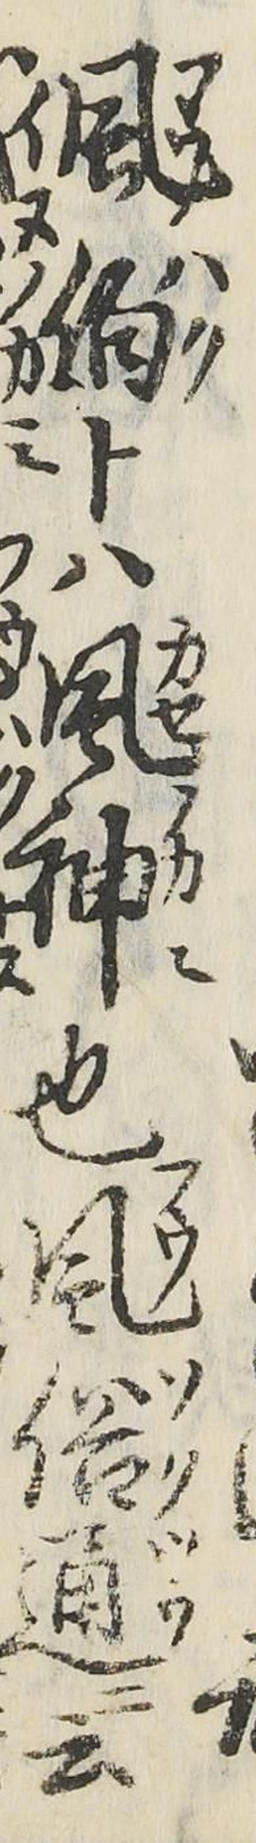風伯トハ風神也風俗通ニ云
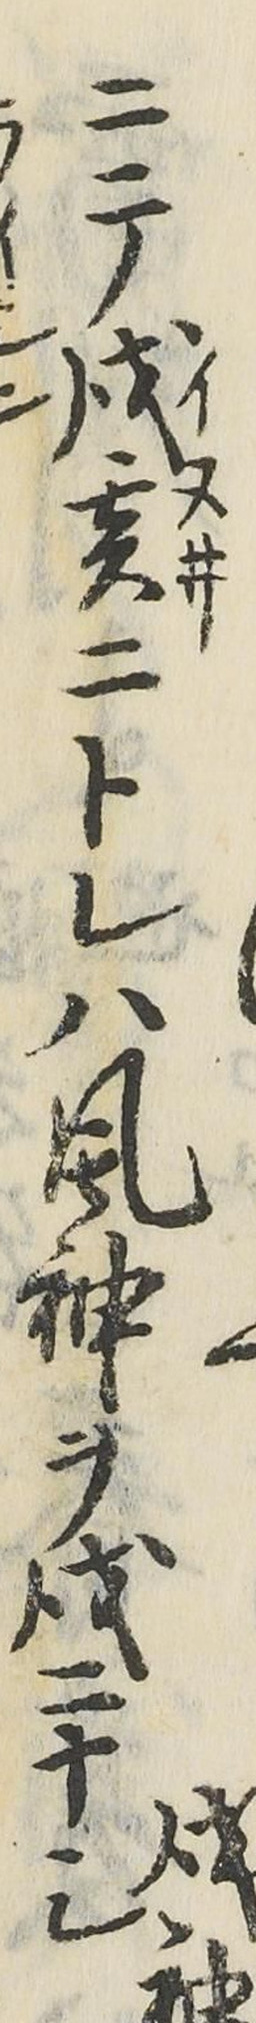ニテ戌亥ニトレハ風神ヲ戌ニナシ
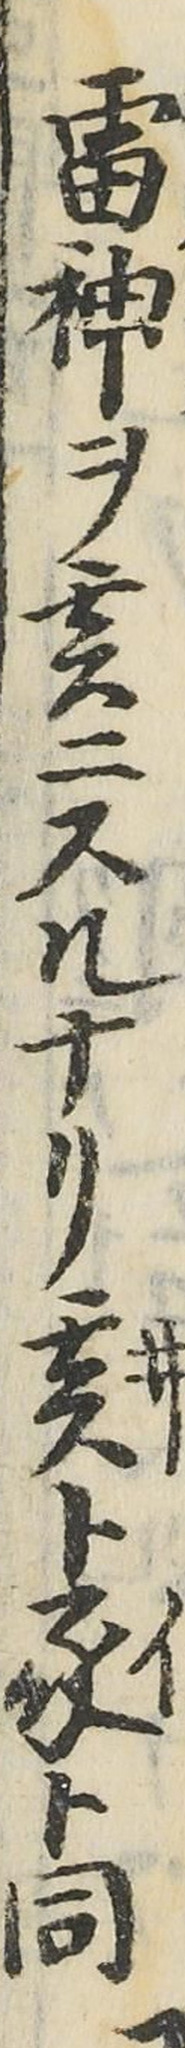雷神ヲ亥ニスルナリ亥ト豕ト同
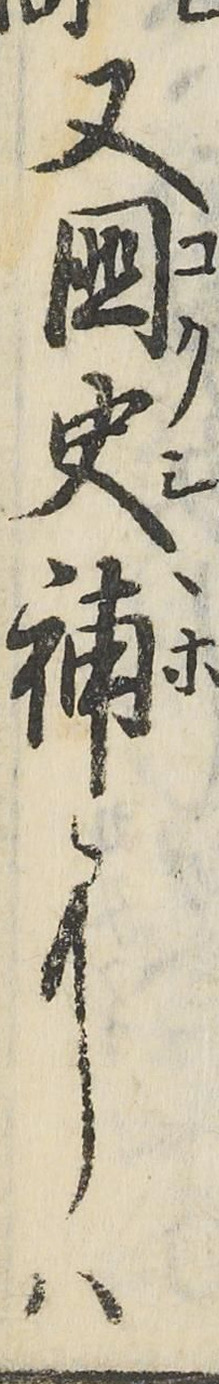又国史補には

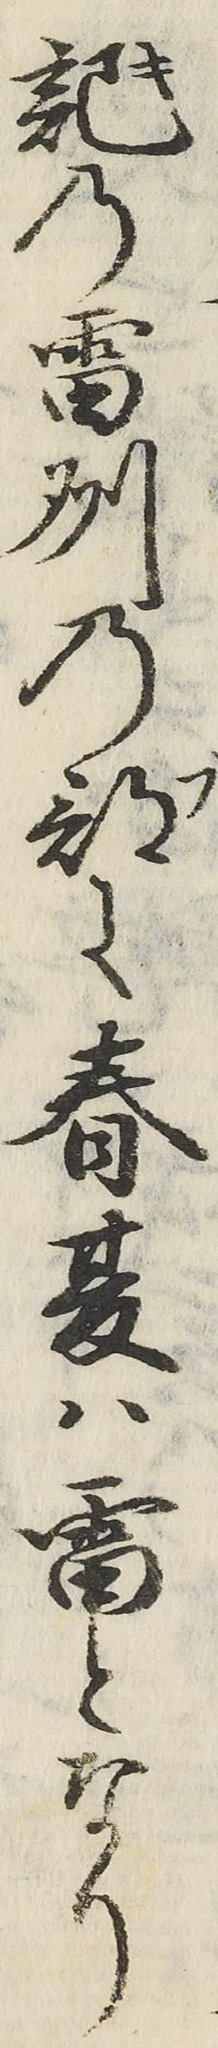記の雷州の部に春夏は雷となり
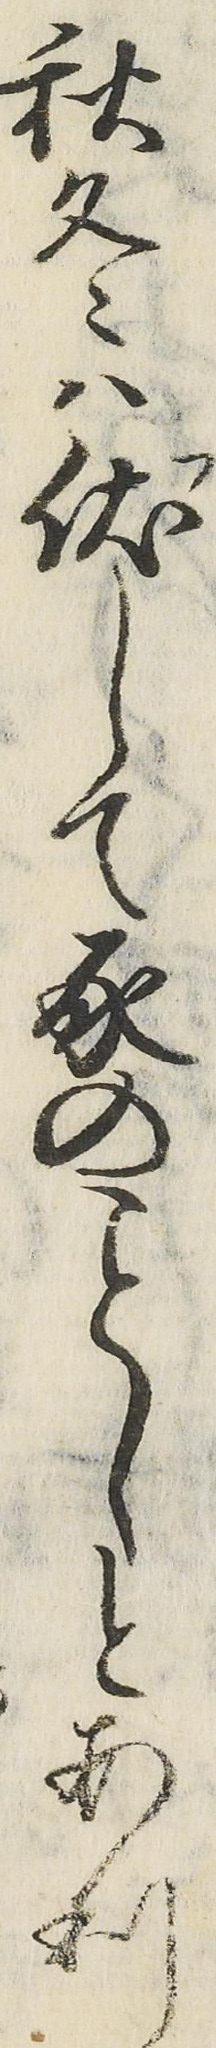秋冬は伏して豕のことしとあり
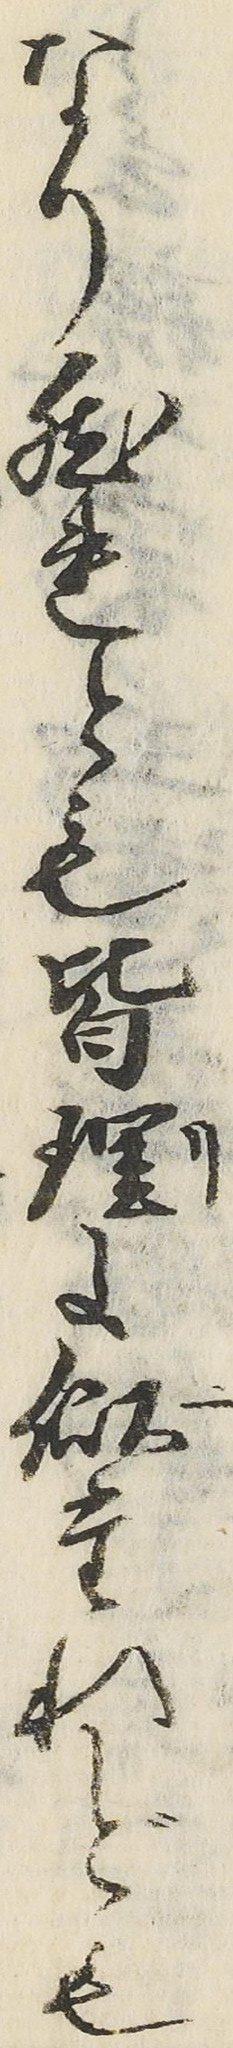なり然れとも皆理に似たれども
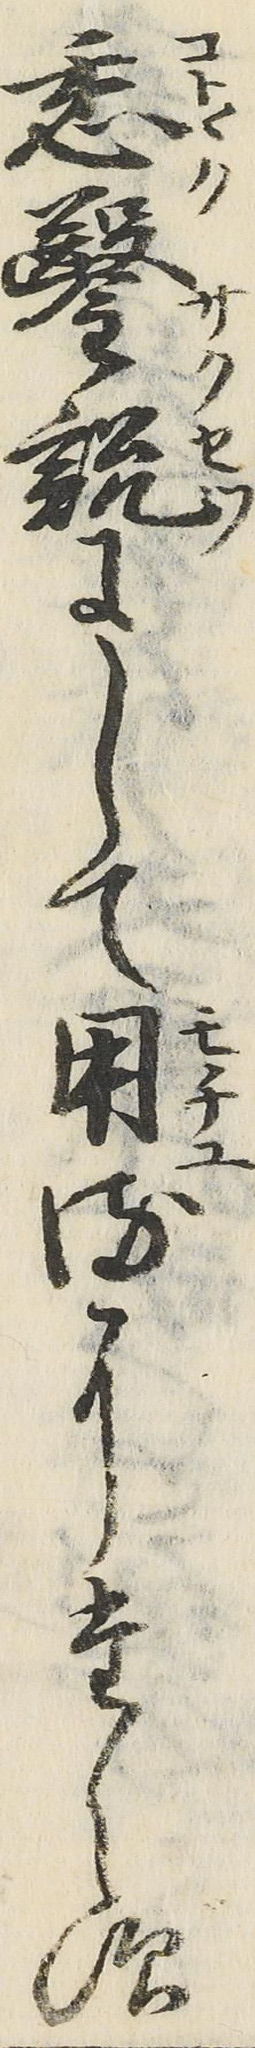悉鑿説にして用るにたらす
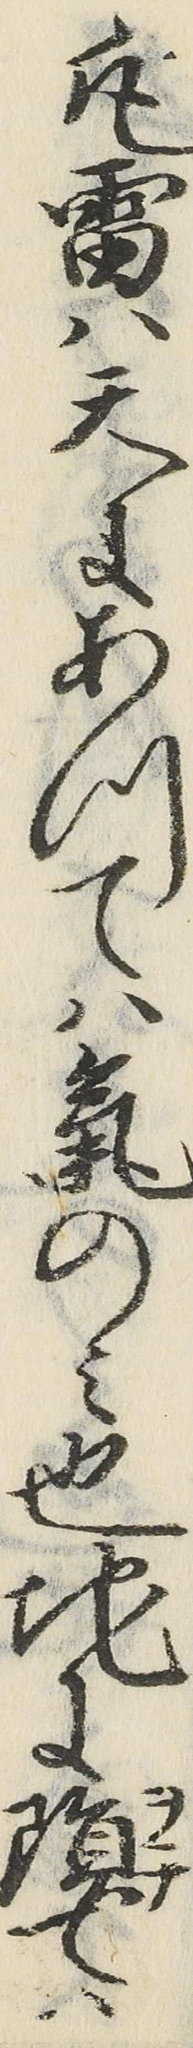凡雷は天にあつては気のみ也地に隕ては
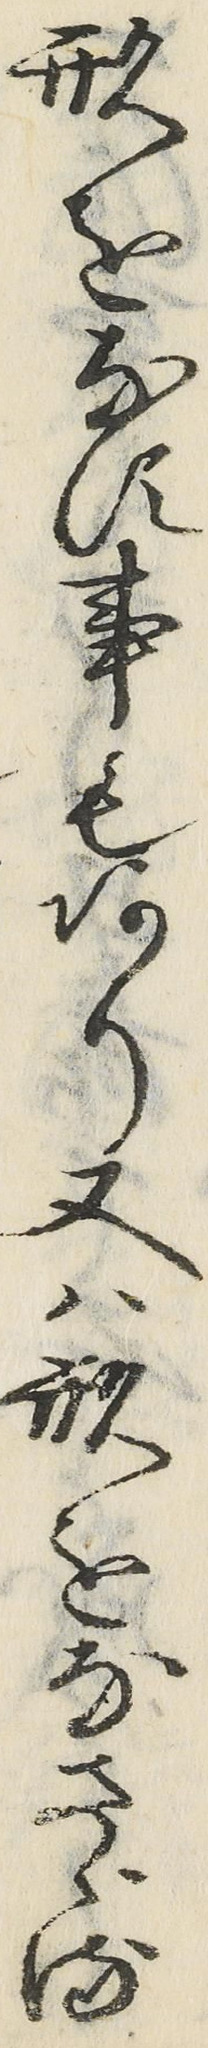形をなす事もあり又は形をなさゞる
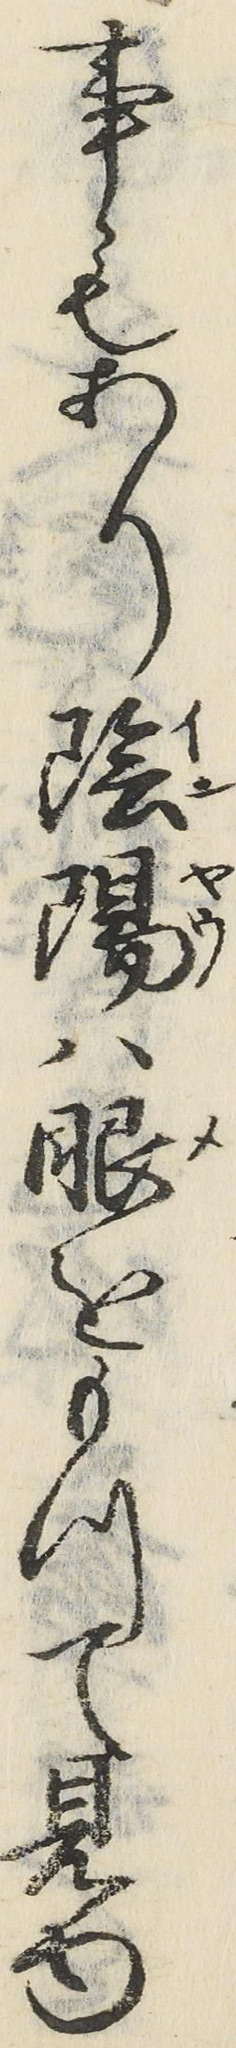事もあり陰陽は眼をもつて見る
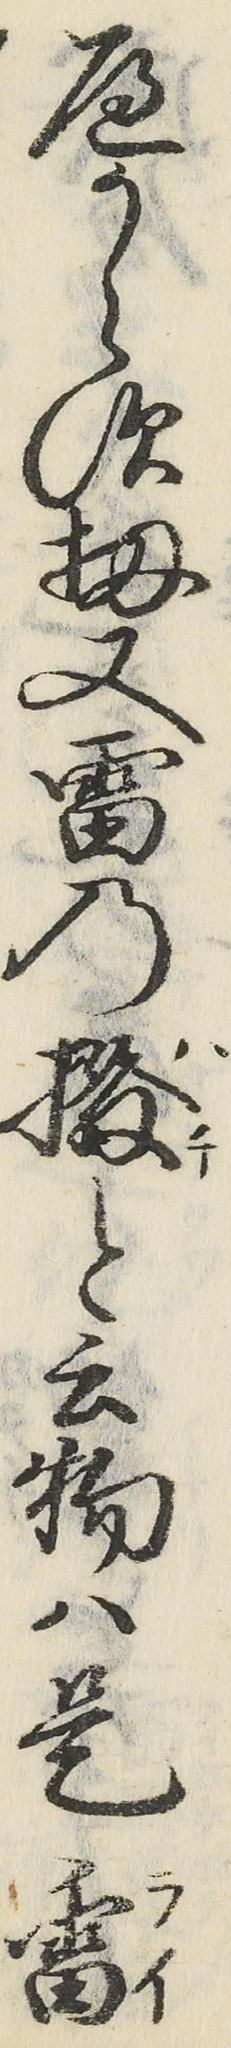へからす扨又雷の撥と云物は是雷
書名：天地或問珍　天
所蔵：東京大学地震研究所図書室 Earthquake Research Institute Library, The University of Tokyo, JAPAN
